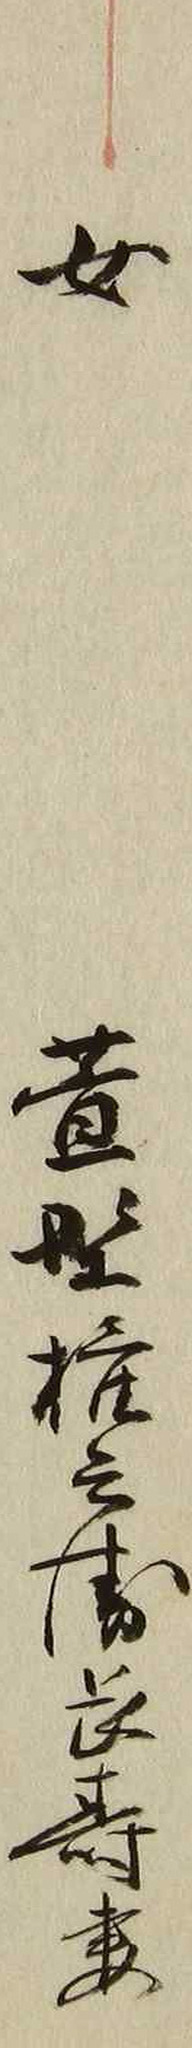女萱野権兵衛長寿妻
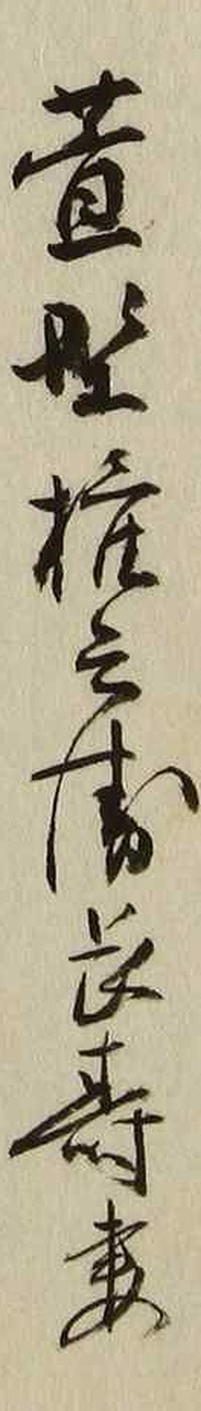女萱野権兵衛長寿妻
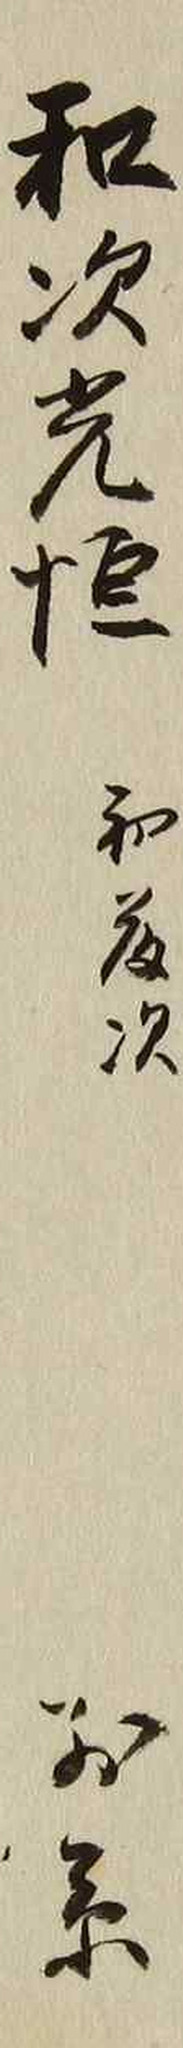和次光恒初藤次別系
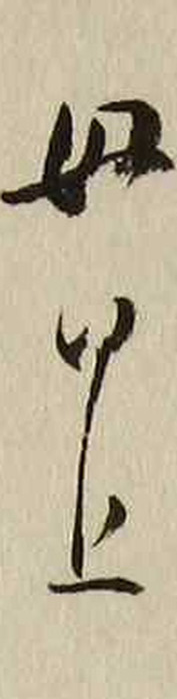母同上
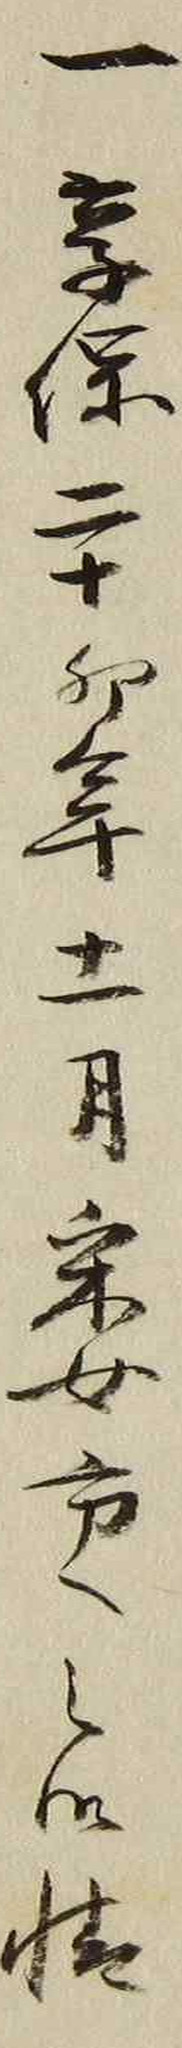一享保二十卯年十一月采女肩へ之御情
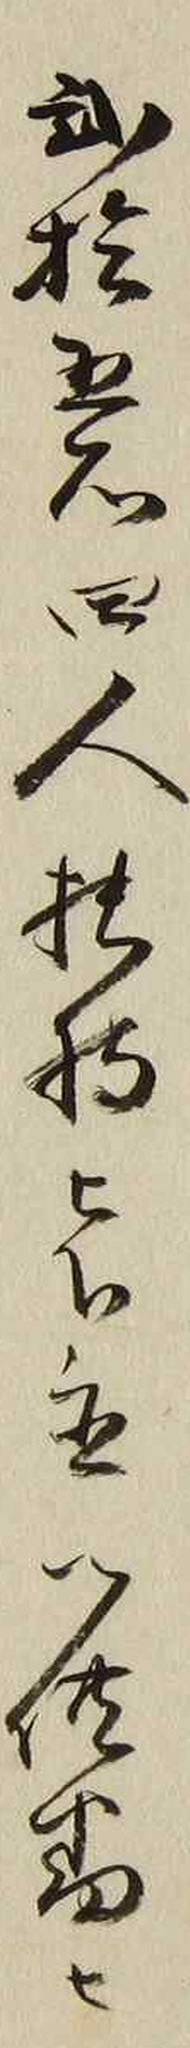弐拾五石四人扶持被下置御供番被
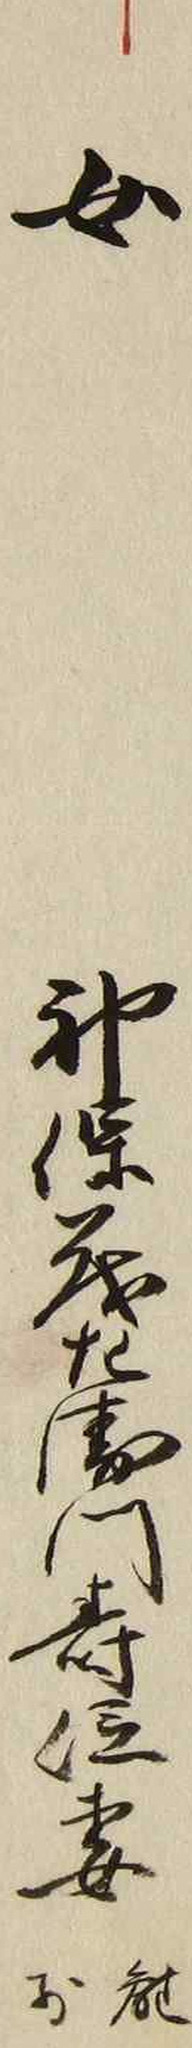女神保茂左衛門寿位妻離別

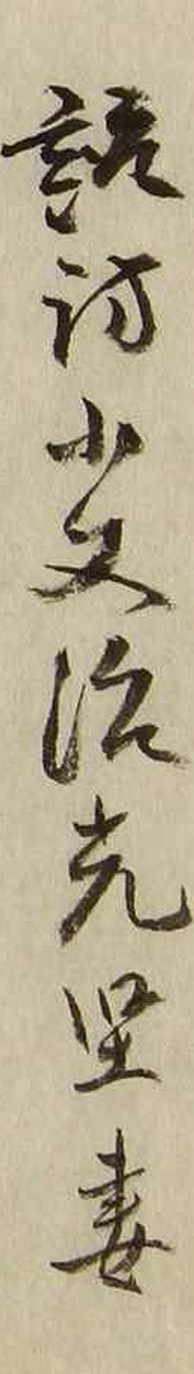諏訪小又治光堅妻
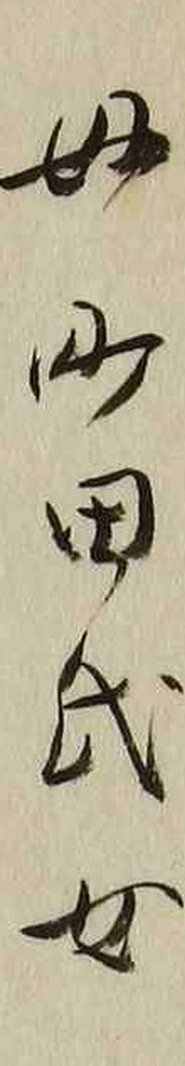母町田氏女
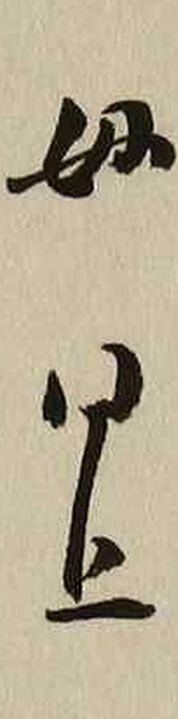母同上
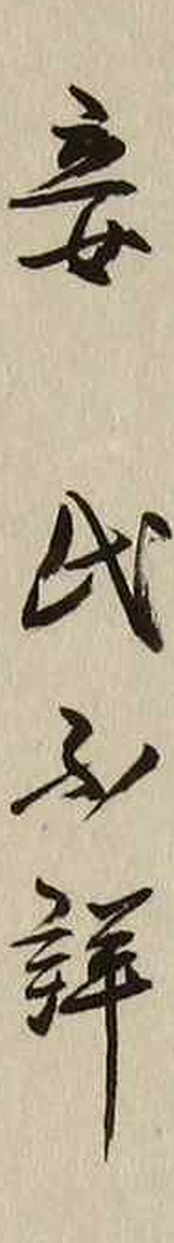妾氏不詳
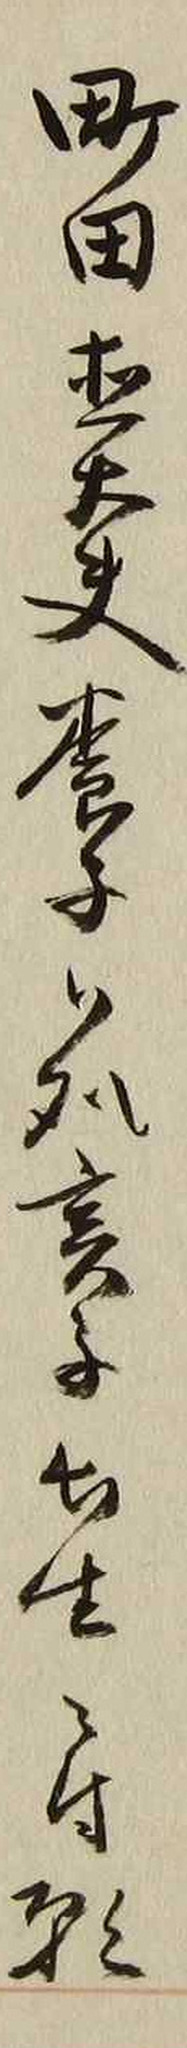町田直太夫養子候処実子出生に付願
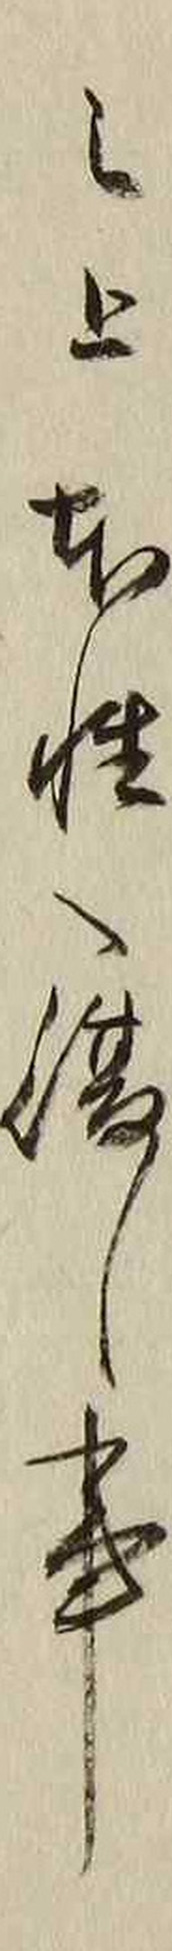之上本性へ復候事
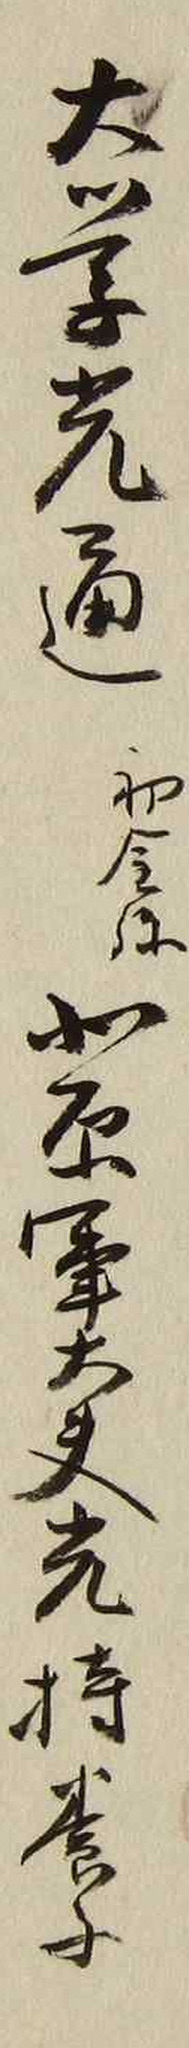大学光道初金弥北原軍太夫光持養子

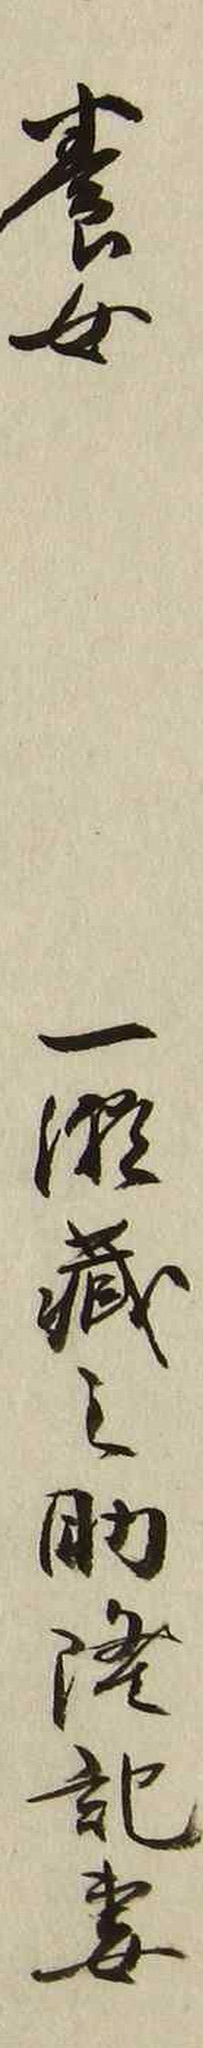養女一瀬蔵之助隆記妻
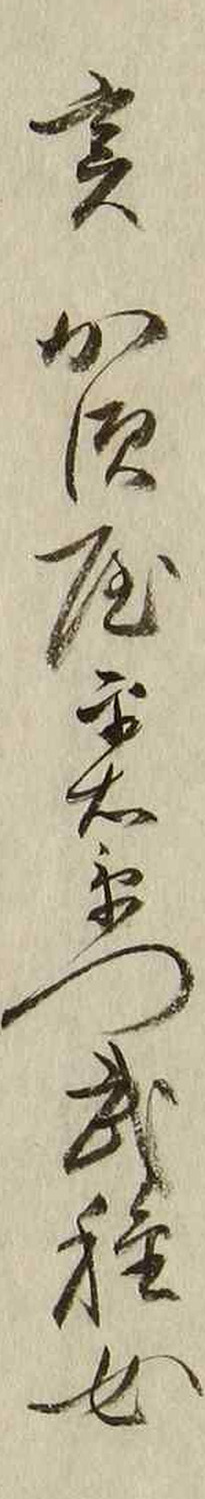妻加須屋平右衛門武種女
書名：諸士系譜　巻之292　き之部1
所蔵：会津若松市立会津図書館
